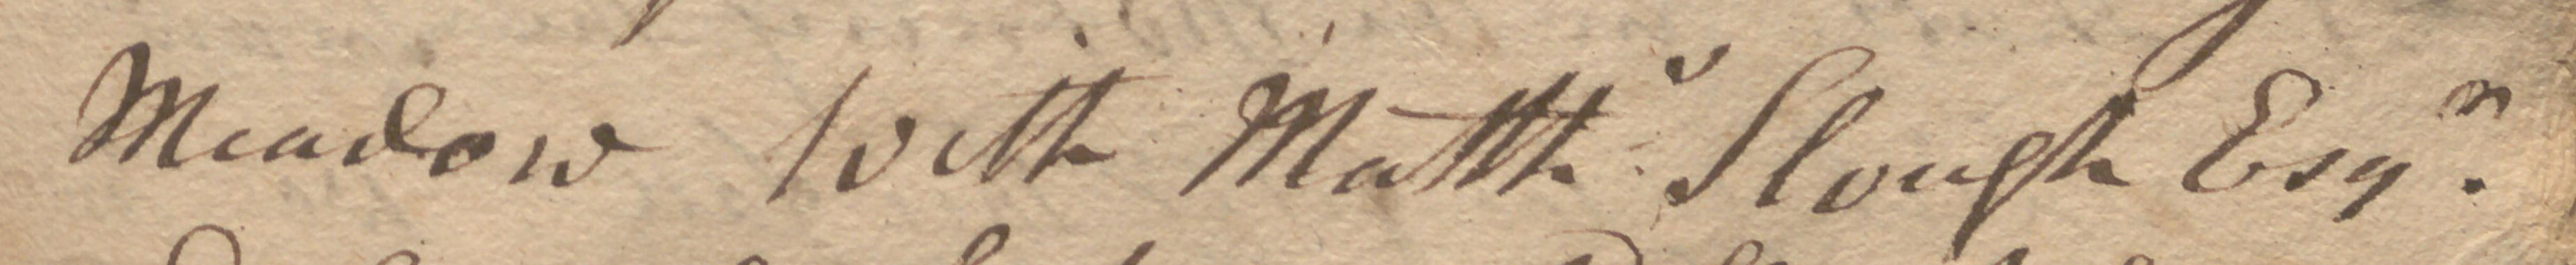Meadow with Matth^s Slough Esq^r.
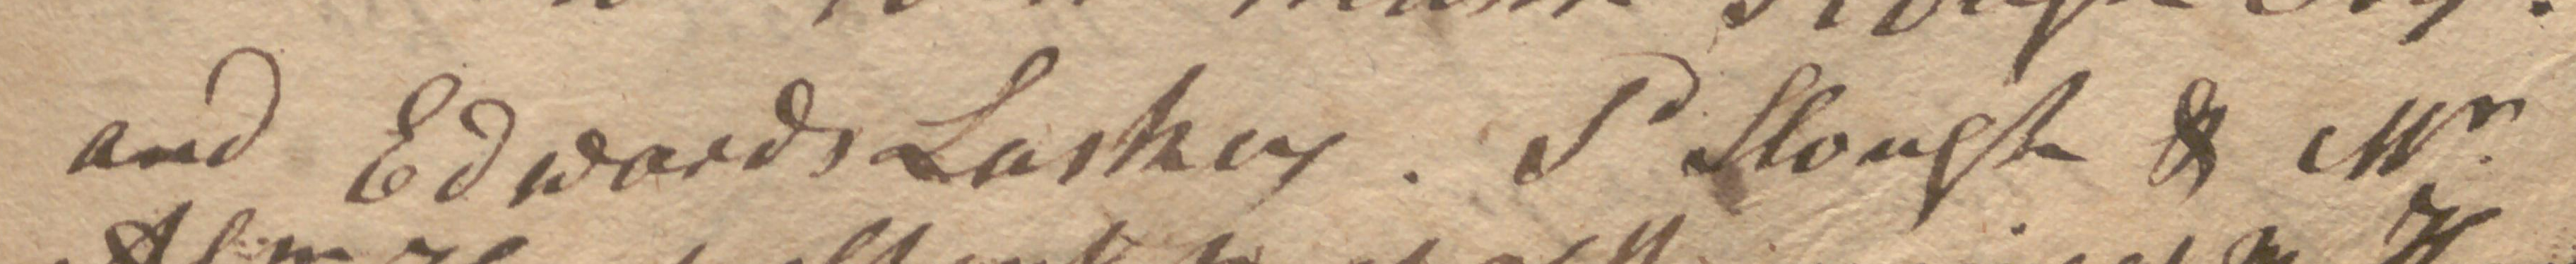and Edwards Laskey. S^d Slough & M^r.
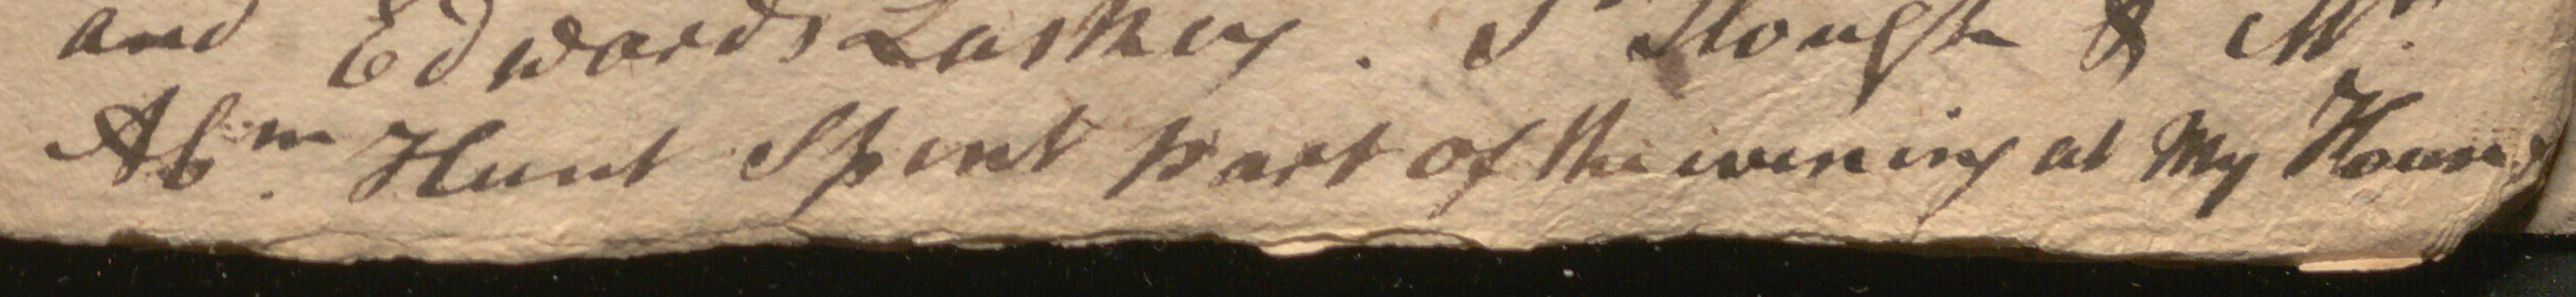Ab^m. Hunt Spent part of the evening at my House
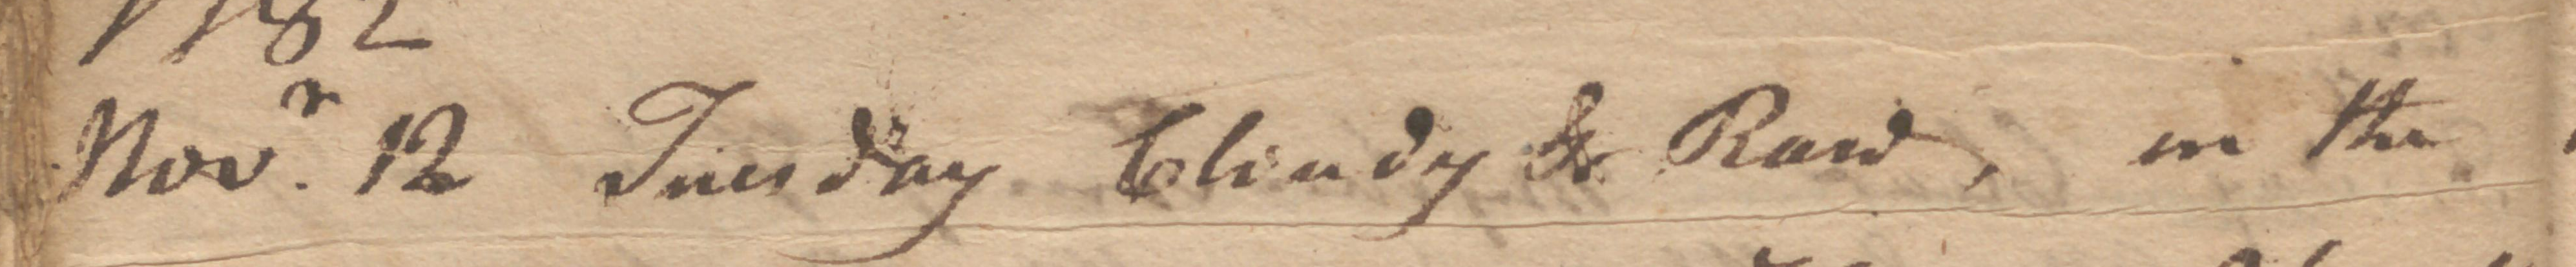Nov^r. 12 Tuesday Cloudy & Raw, in the
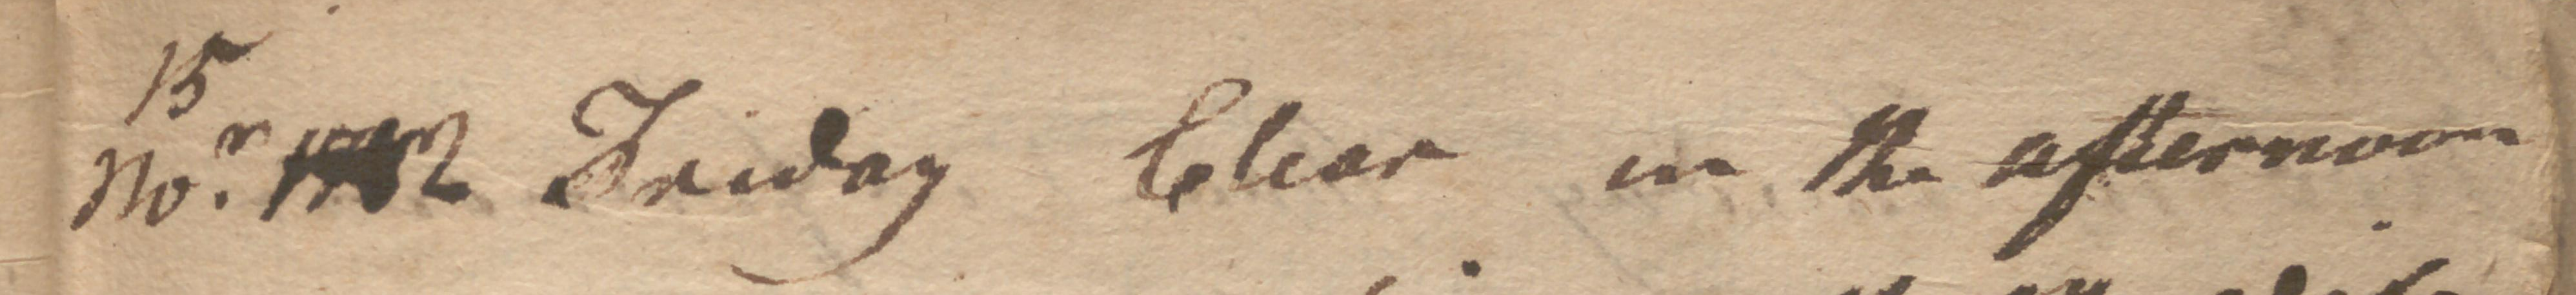No^r. 1782 Friday Clear in the afternoon
